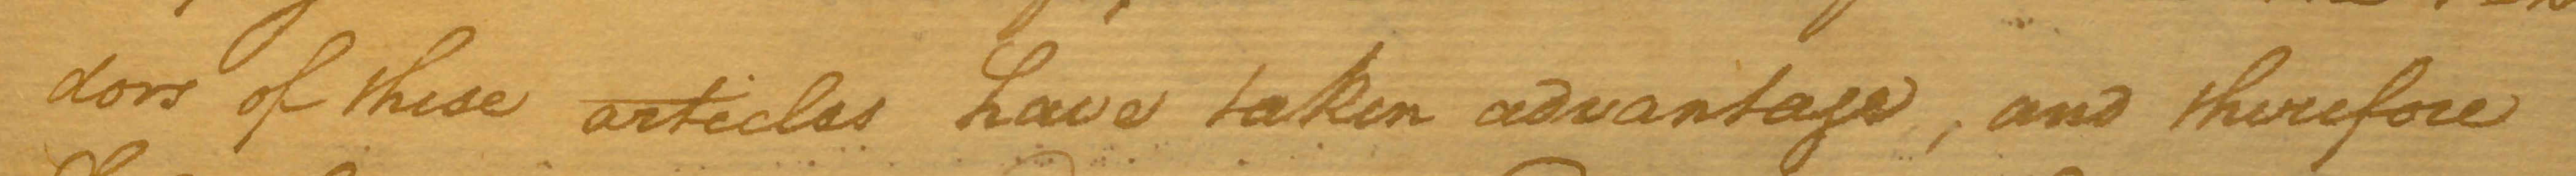dors of these articles have taken advantage, and therefore
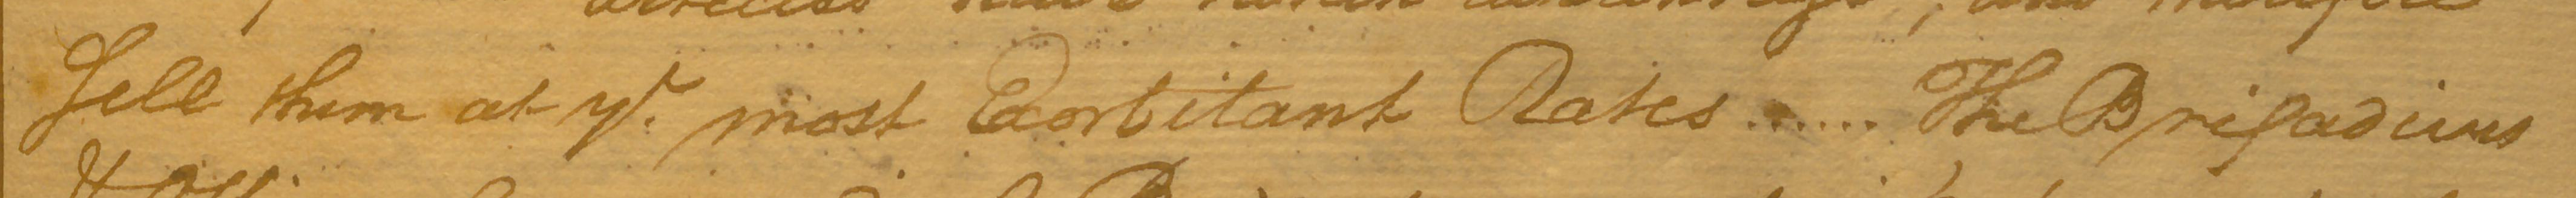sell them at y^e. most Exorbitant Rates...... The Brigadiers
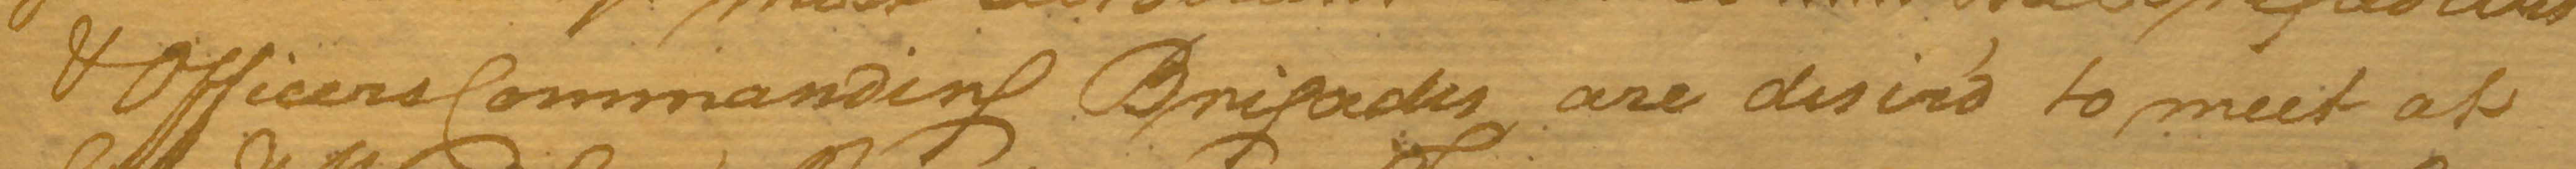& Officers Commanding Brigades are desir'd to meet at
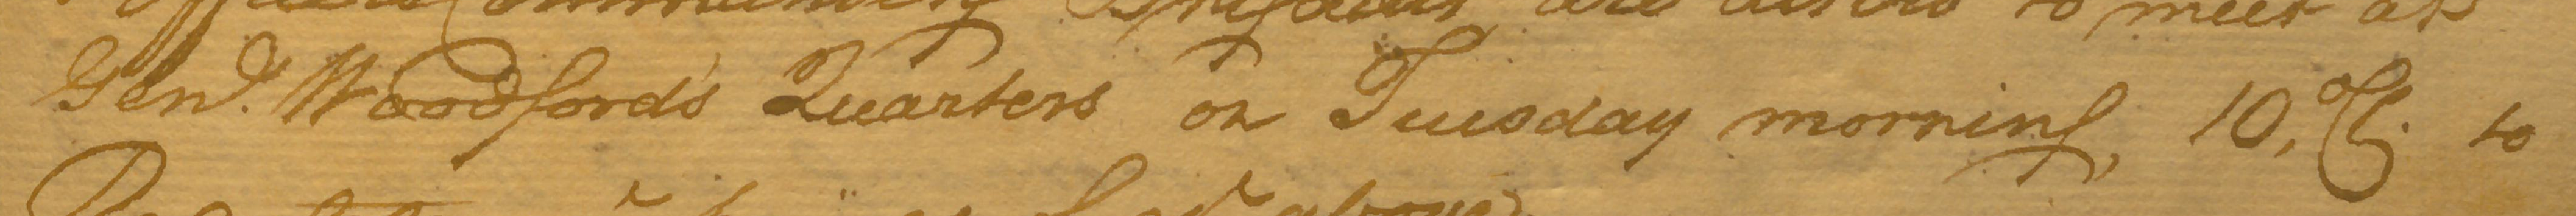Gen^l. Woodford's Quarters on Tuesday morning, 10. ^oCl. to
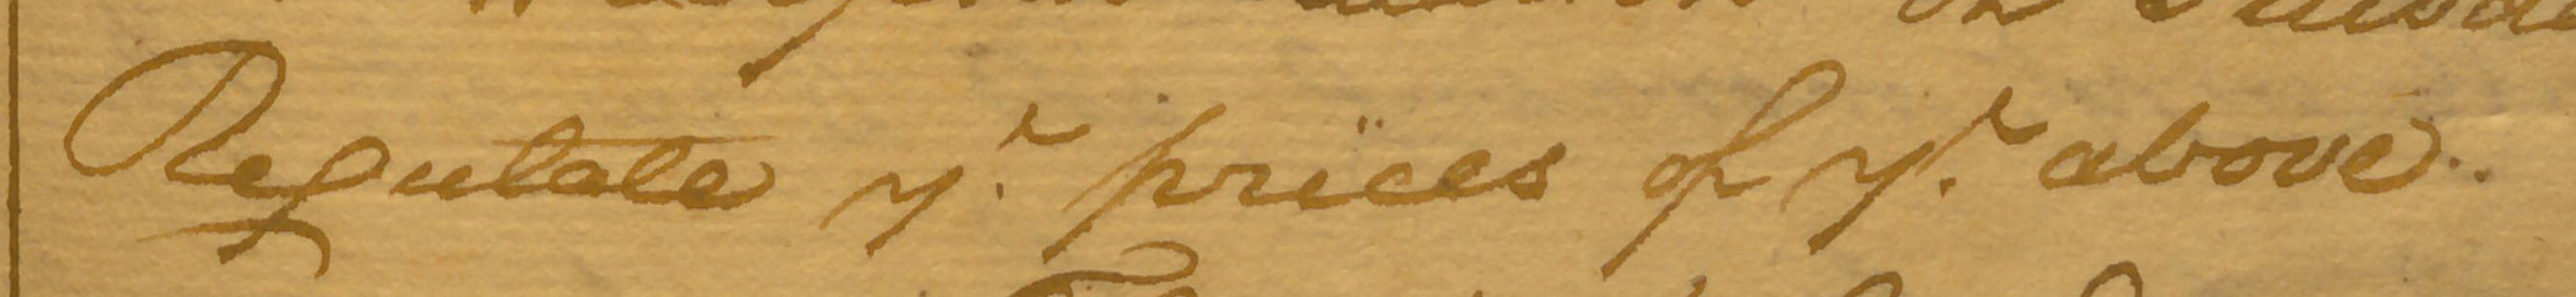Regulate y^e. prices of y^e. above.
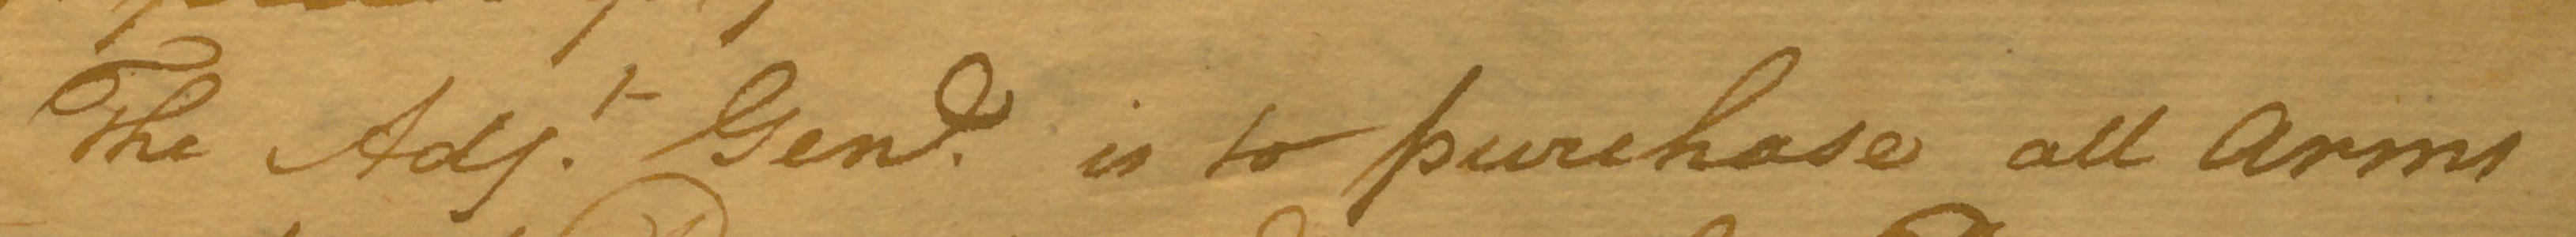The Adj^t. Gen^l. is to purchase all Arms
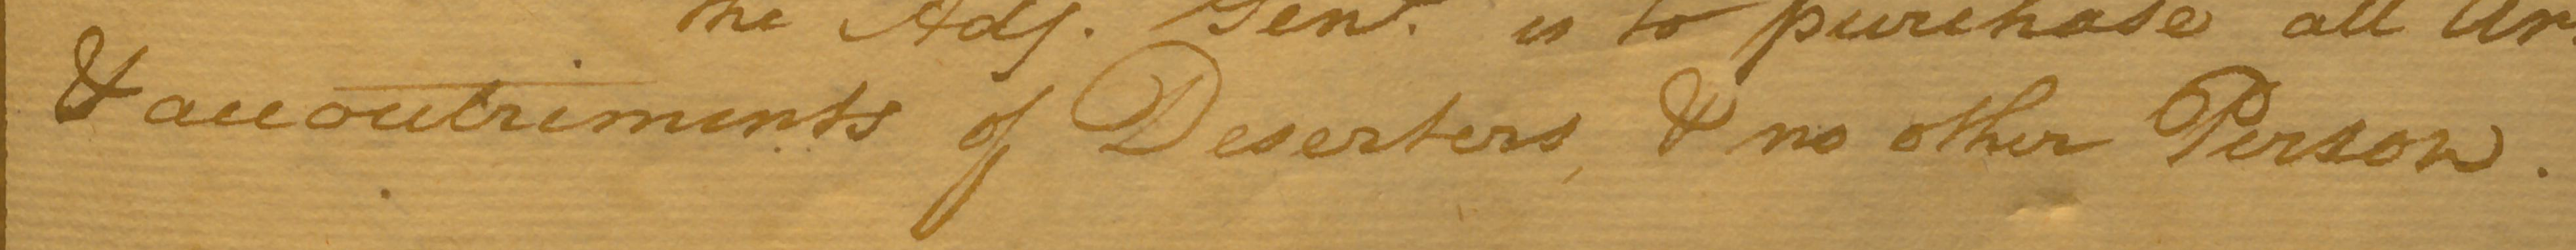& accoutriments of Deserters, & no other Person.
